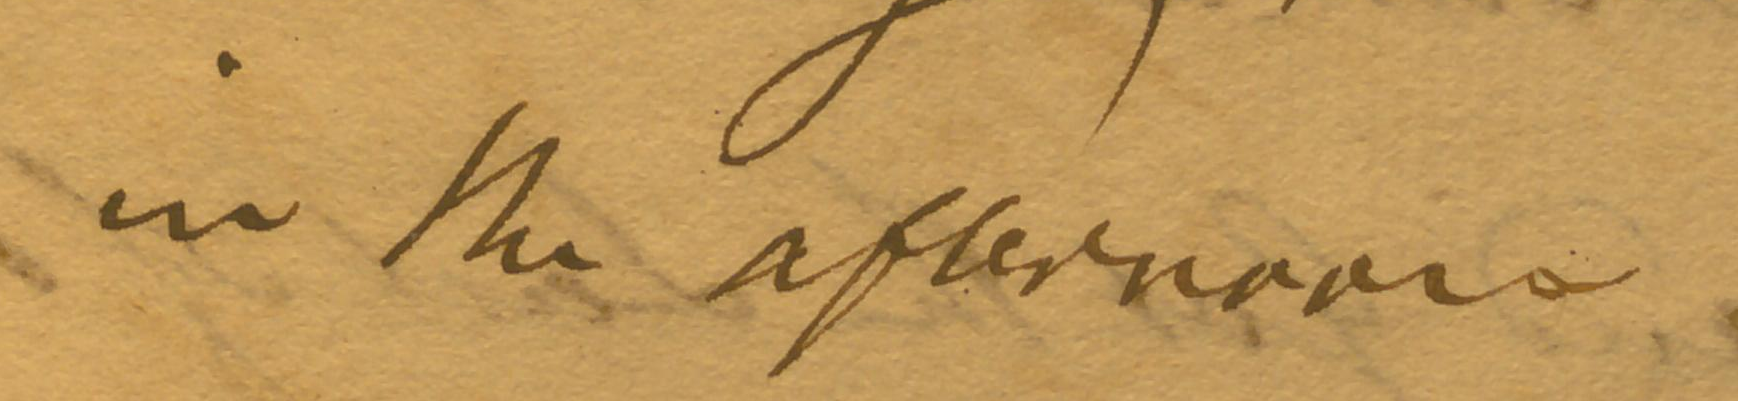in the afternoon
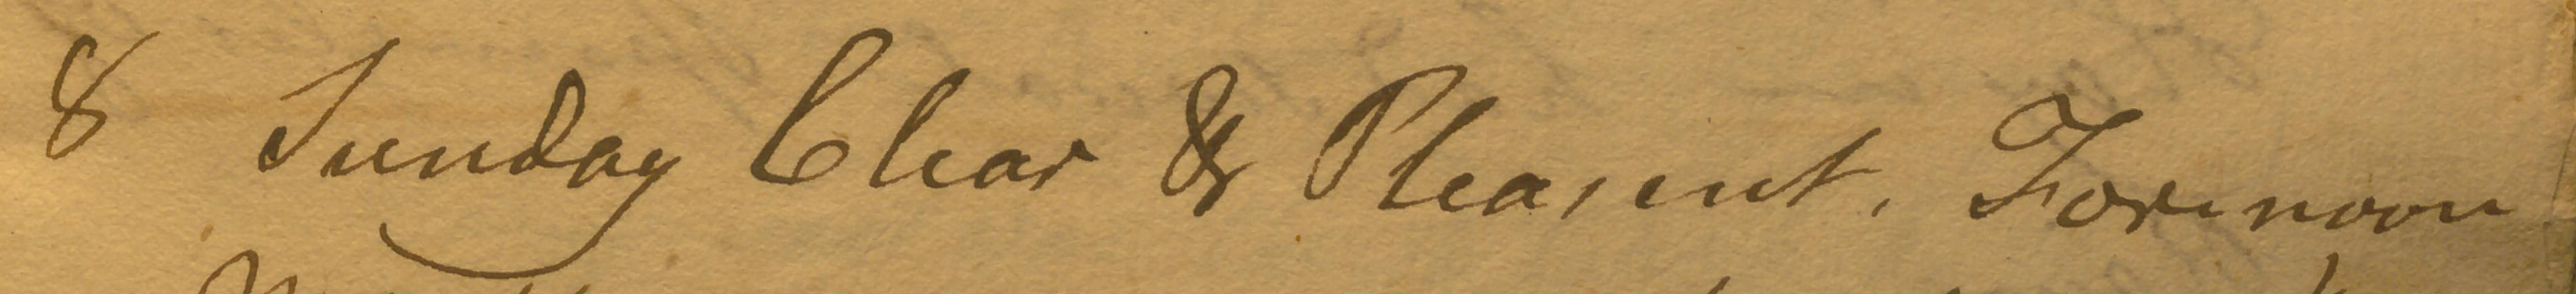8 Sunday Clear & Pleasent. Forenoon
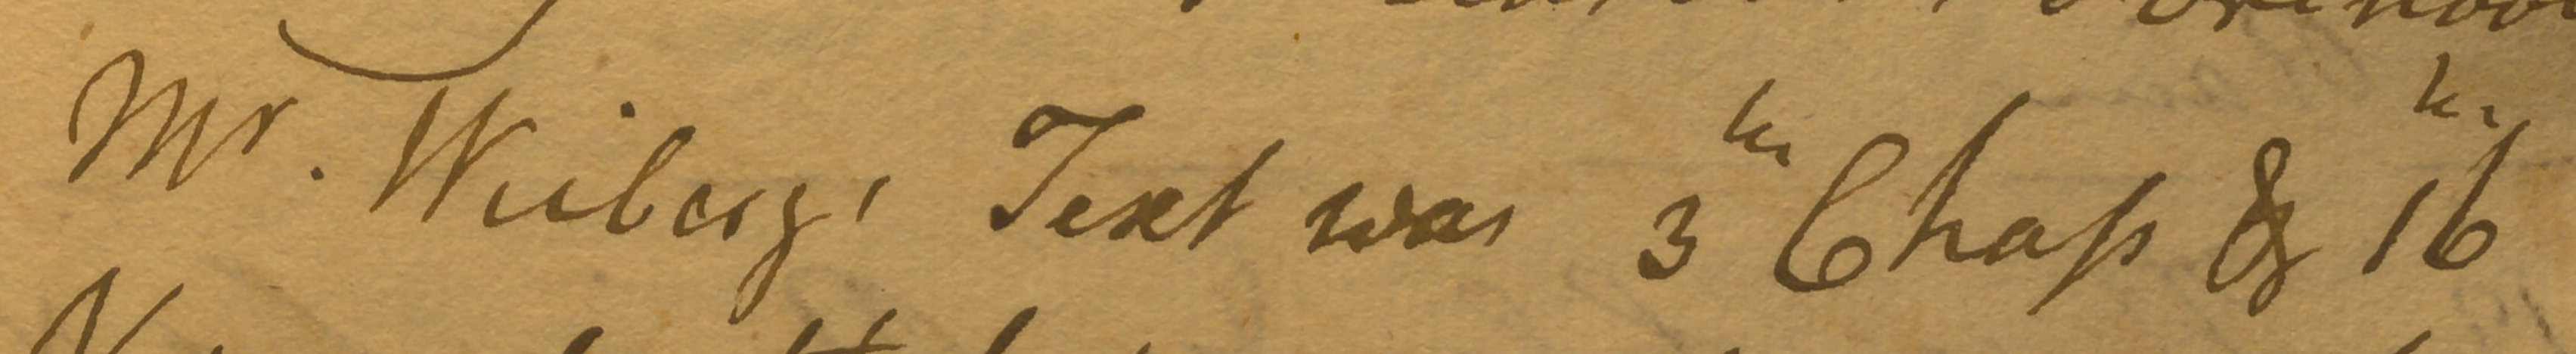M^r. Weibergs Text was 3^th Chap & 16^th
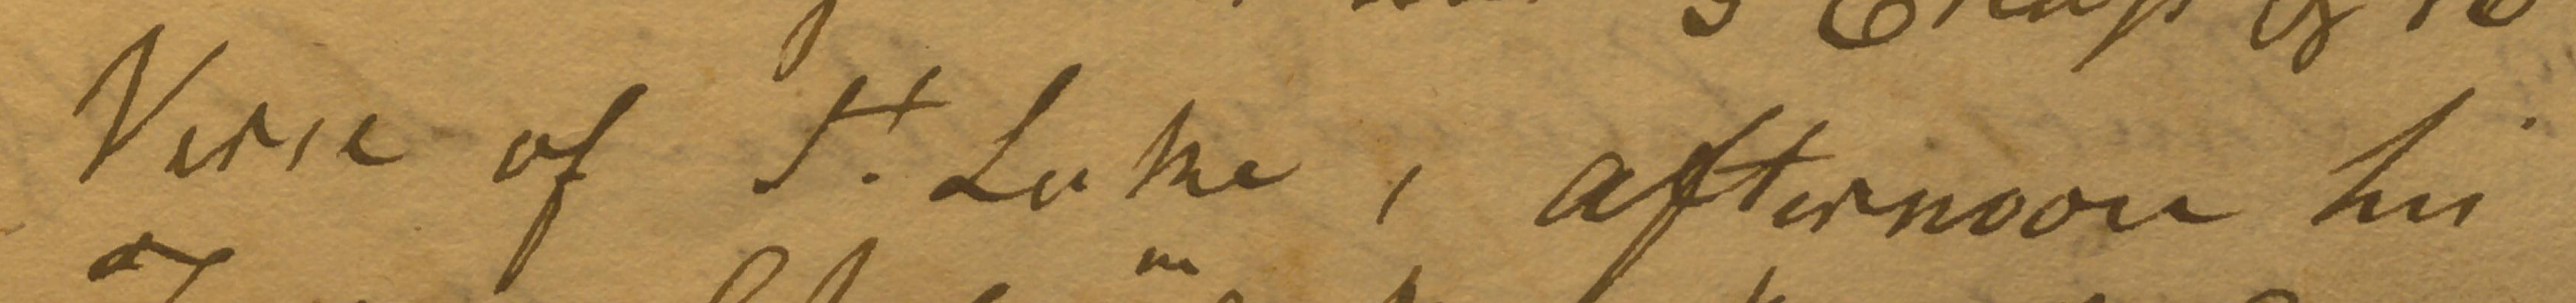Verse of S^t. Luke, afternoon his
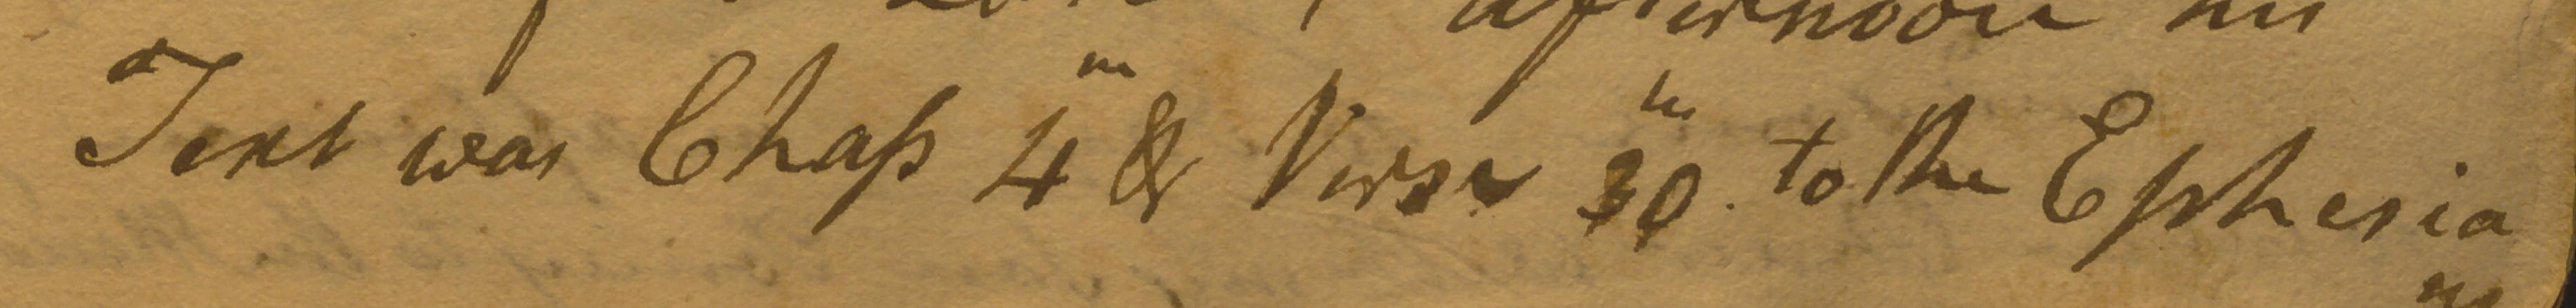Text was Chap 4^th & Verse 30^th. to the Ephesia
